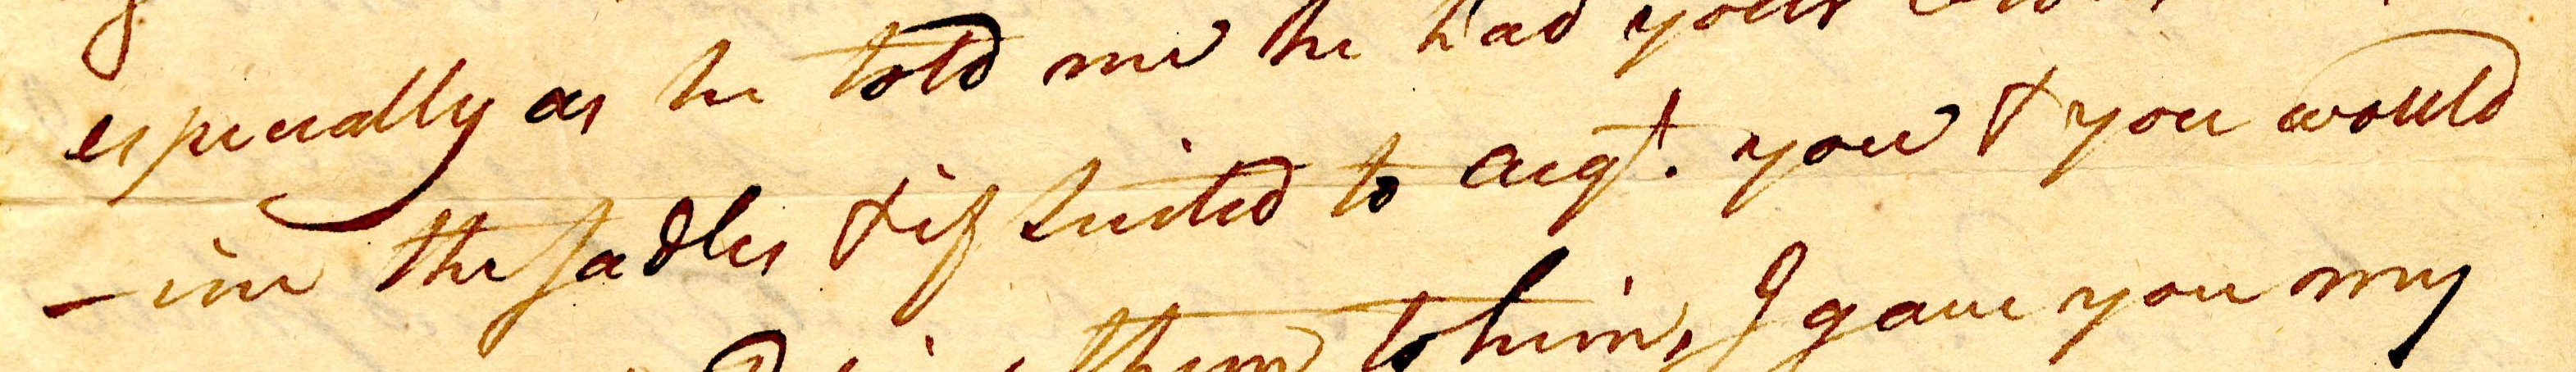-in the sadles & if decided to acq^t. you & you would
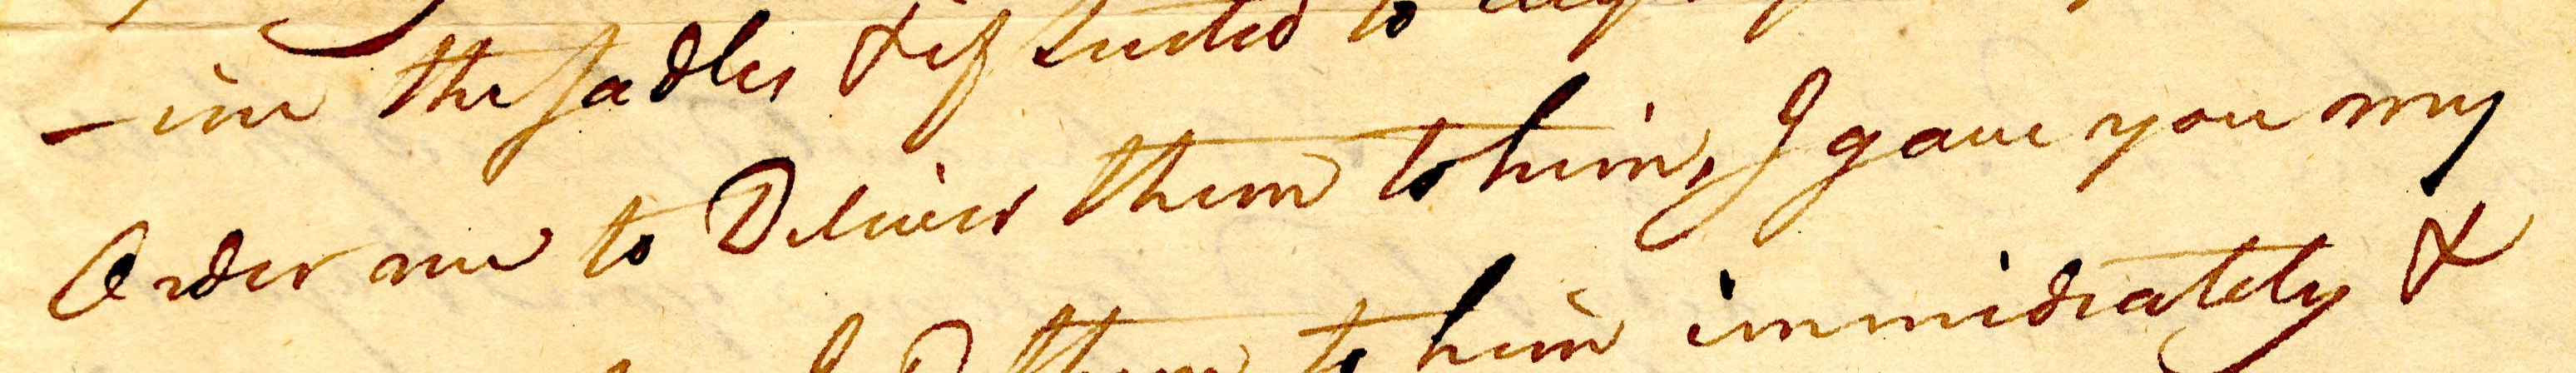Order me to deliver them to him I gave you my
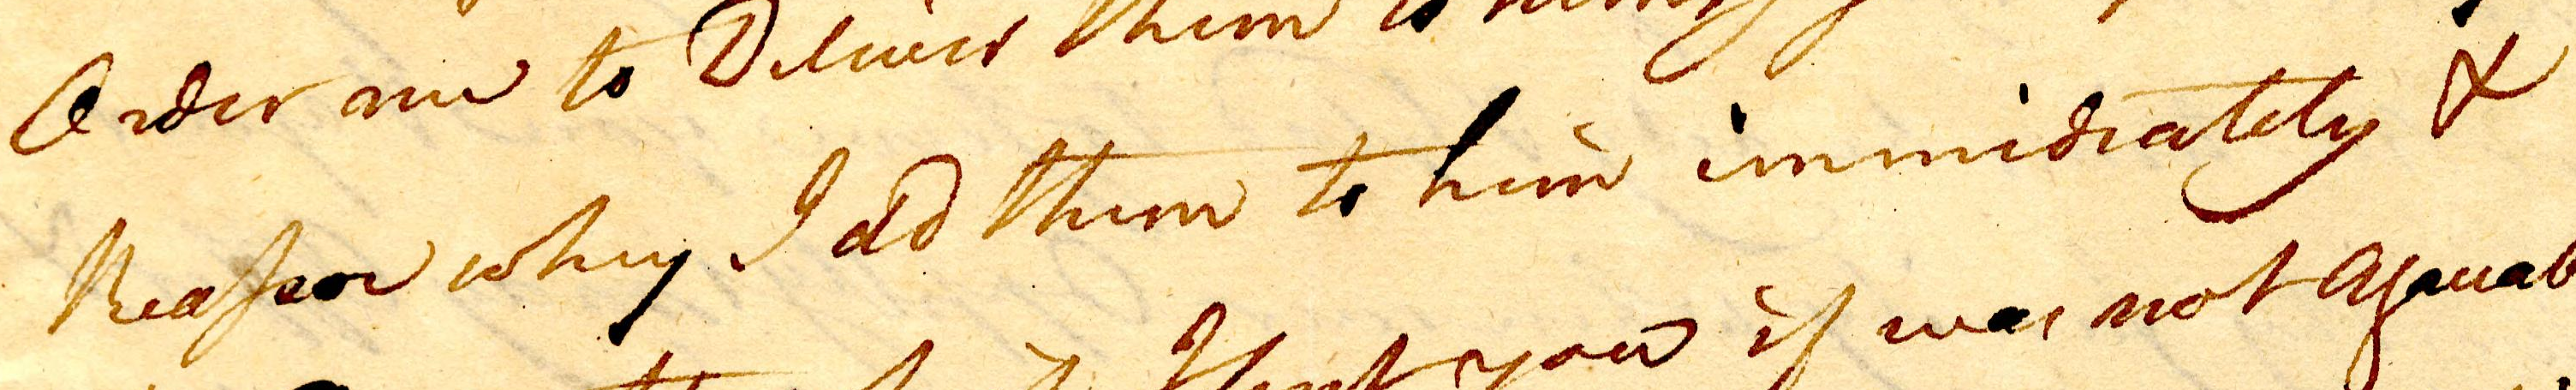Reason why I ad them to him immediate &
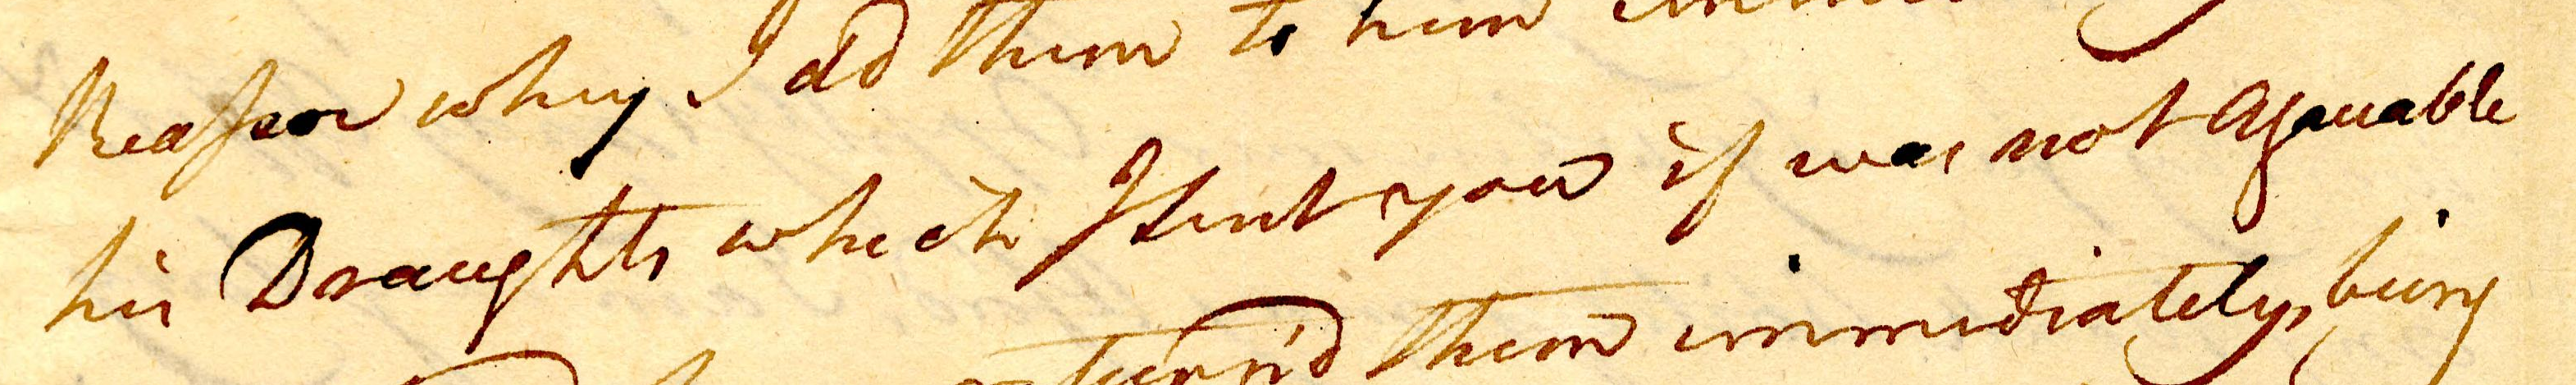his Draughts which I sent you if was not agreeable
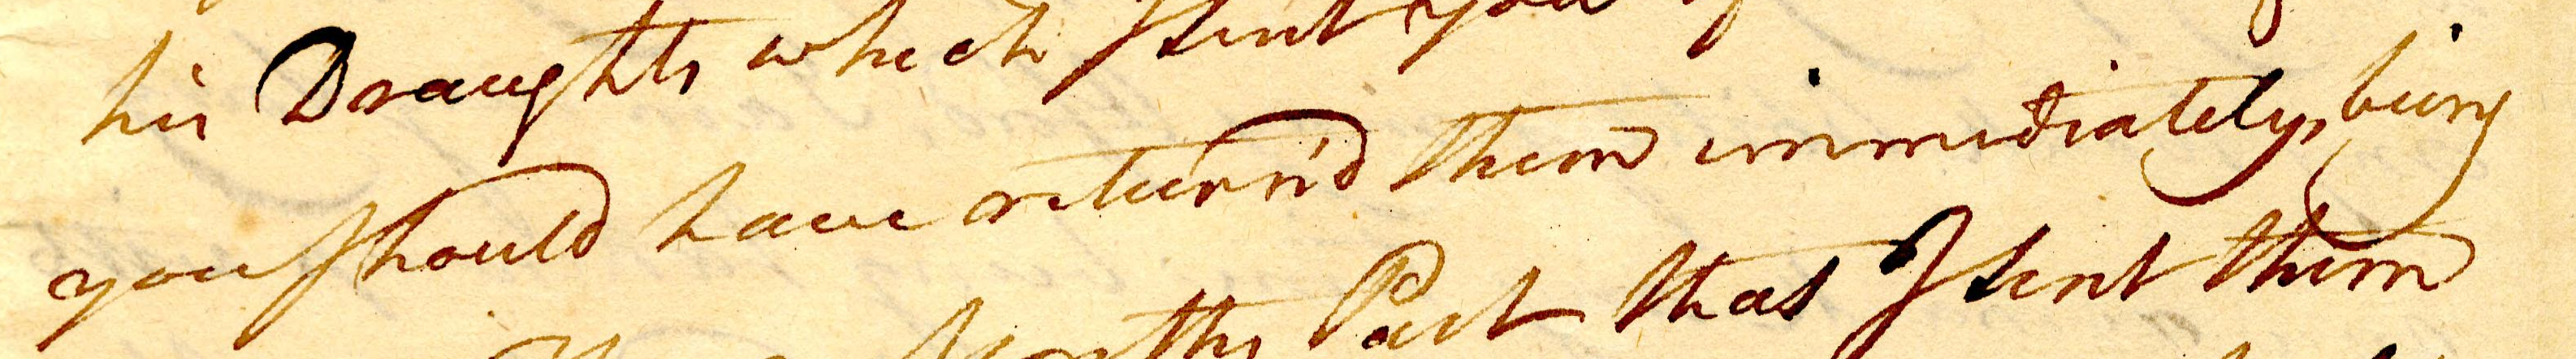you should have return'd them immediately, being
